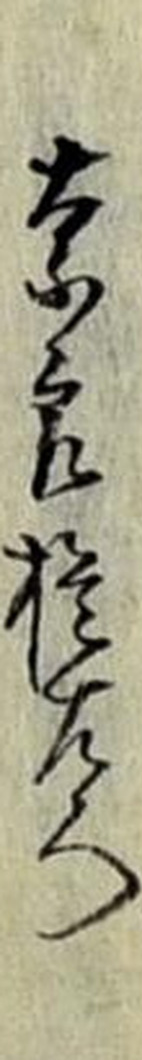奈良権左衛門
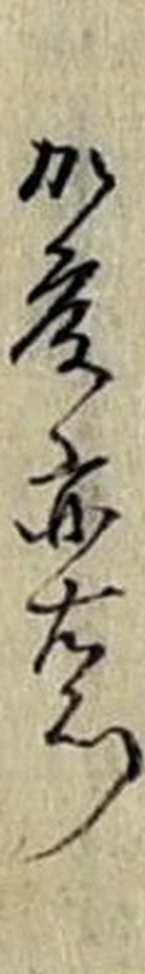加藤亦右衛門
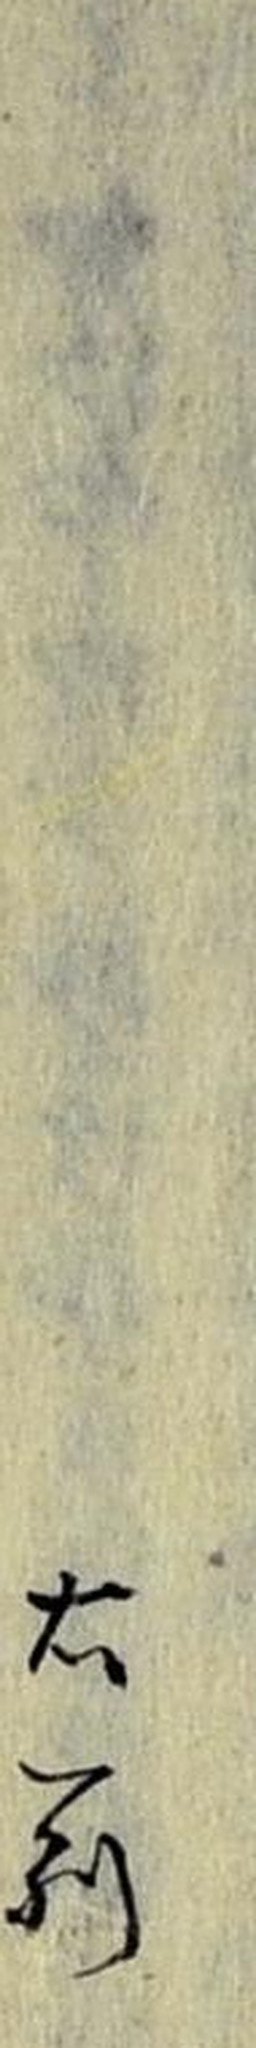右一列
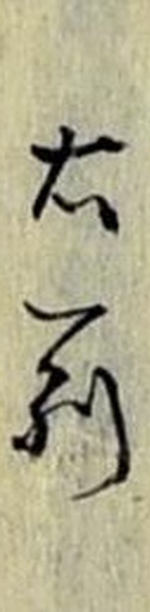右一列
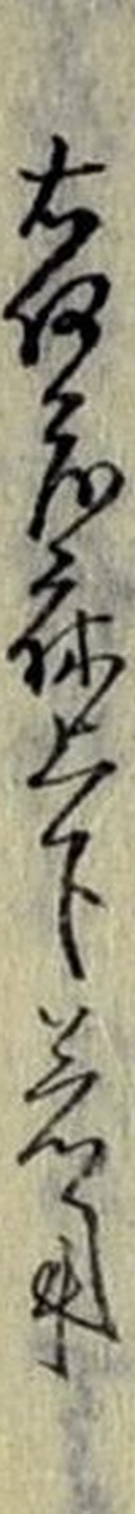右何茂麻上下着用
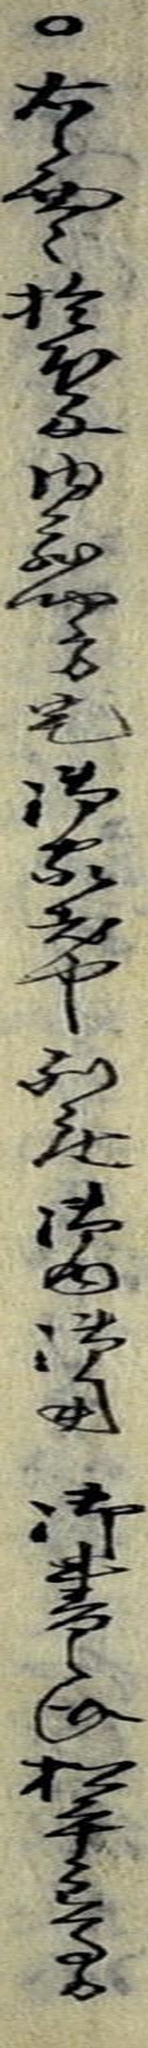〇右之面々於本多内蔵助方宅御家老中列座御内御用御書之趣松平主馬方
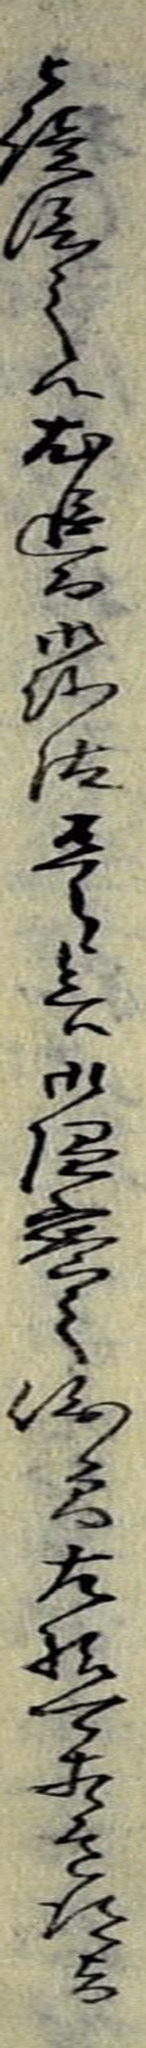被読渡之候尤追而御沙汰有之候迄ハ御隠密之儀候間左様可相意得候旨
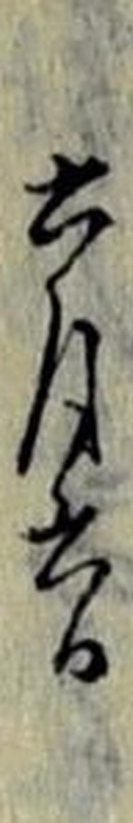六月六日
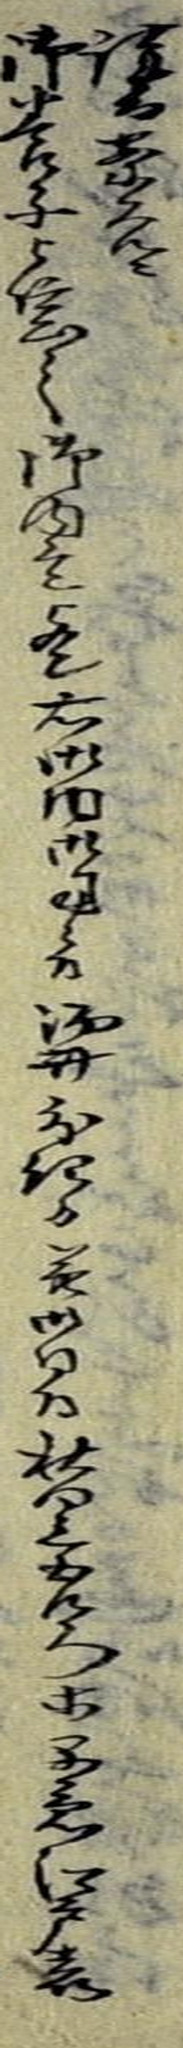御養子被仰出之御内意歟右御内御用ニ付酒井外記方并御目付秋田三五左衛門等早急江戸表
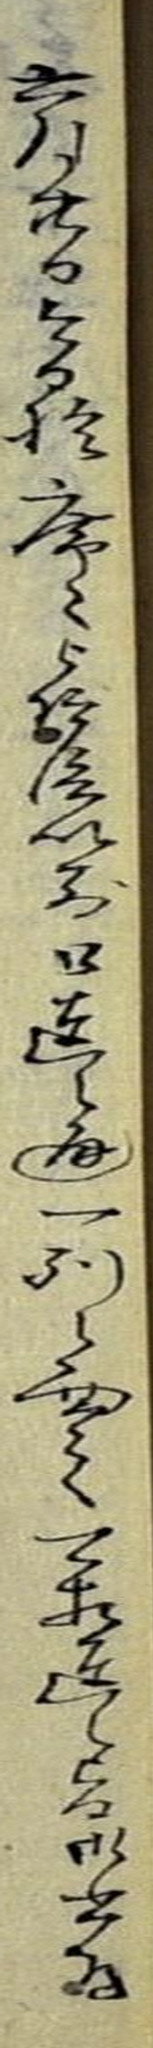六月廿日今日於席々日仰渡以前口達之通一列之面々へ可相達之旨御書付
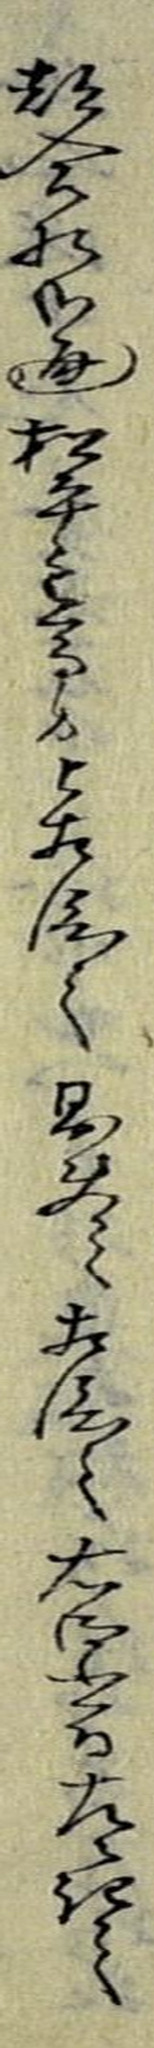都合拾弐通松平主馬方被相渡之則夫々へ相渡之右御書付左ニ記之
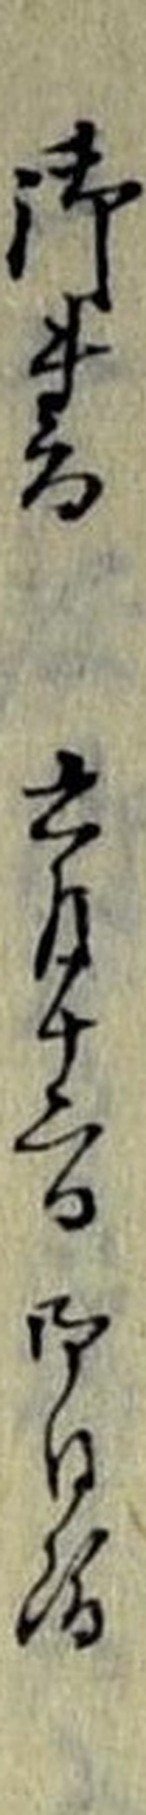御書六月十二日御目付
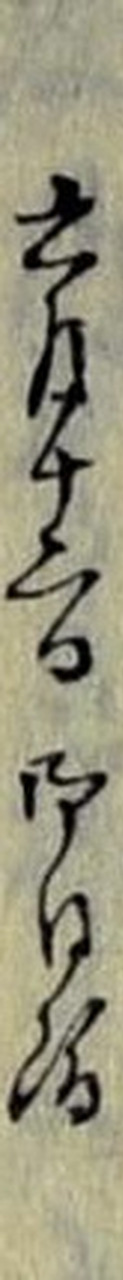御書六月十二日御目付
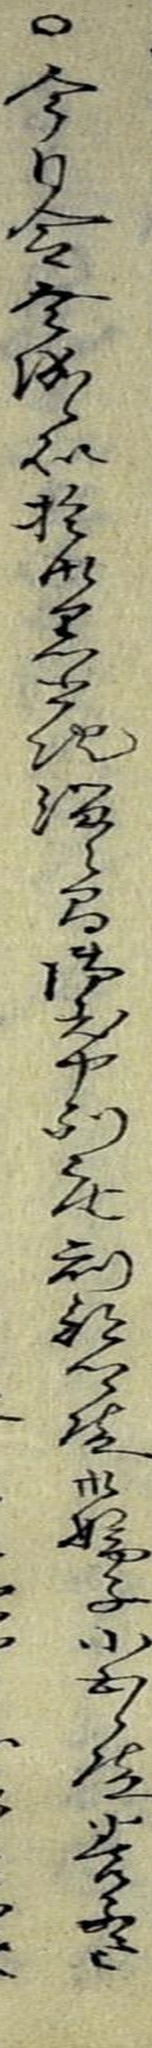〇今日令登城候処於御黒書院溜之間御老中列座刑部卿殿御嫡子小五郎殿養子ニ被
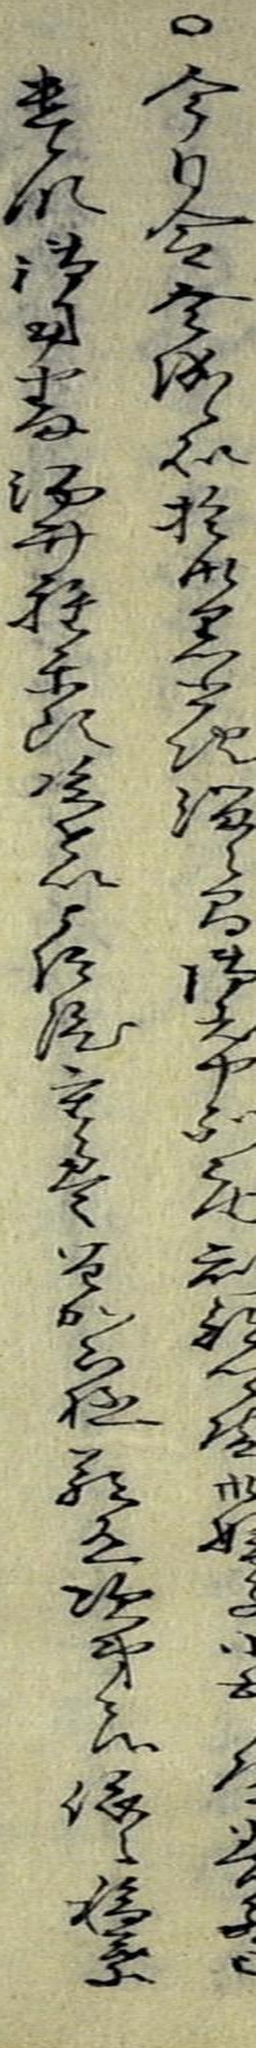遣候段御用番酒井雅樂頭殿を以被仰渡重畳冥加至極難有次第ニ候依之稲葉
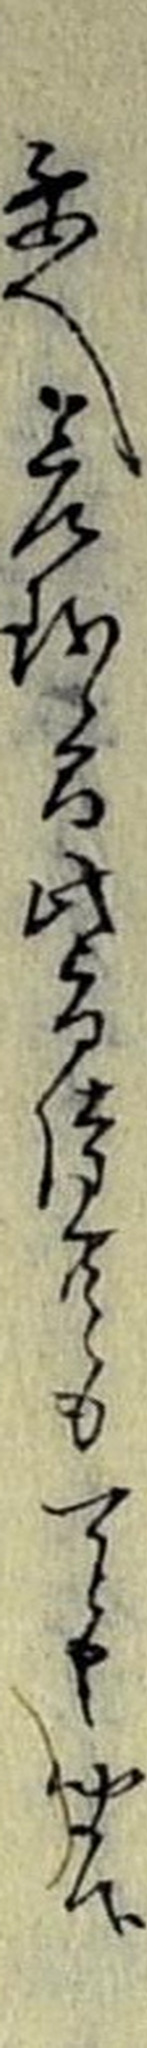要人差越候間此旨侍共へも可被申聞候
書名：命令之部 一
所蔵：福井県文書館 Fukui Prefectural Archives
